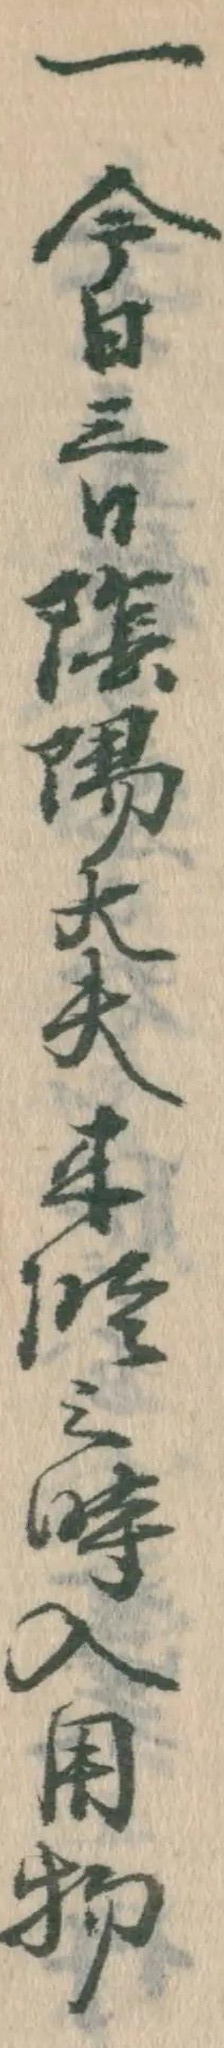一今日三日陰陽大夫来修之時入用物

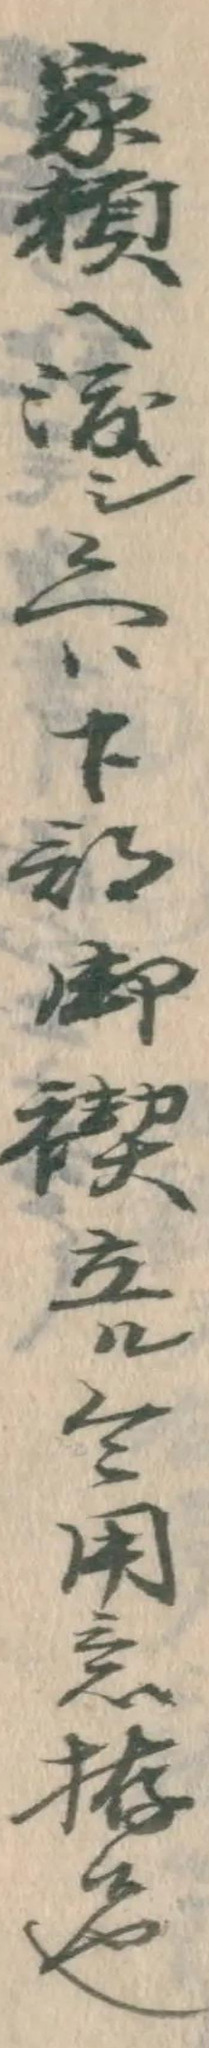家頼へ渡シ候へハ下部御禊立ル令用意拵候也
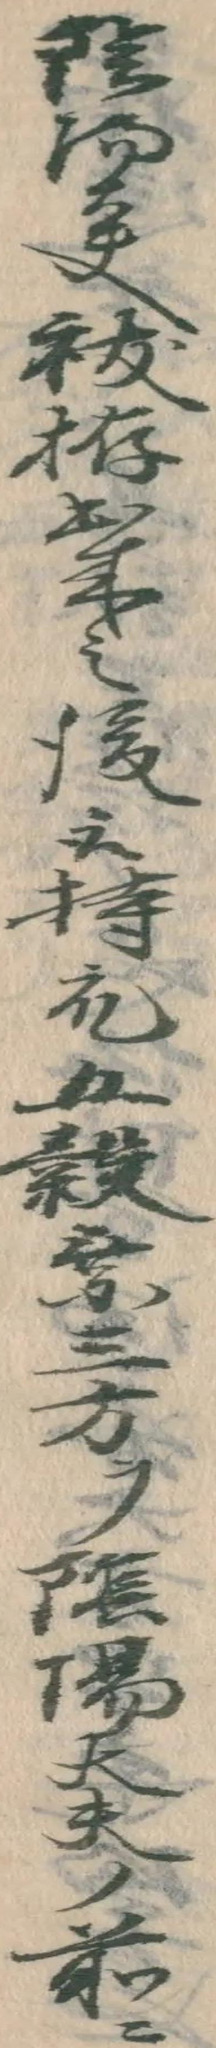陰陽大夫祓拵出来之後取持衆五穀乗三方ヲ陰陽大夫ノ前ニ
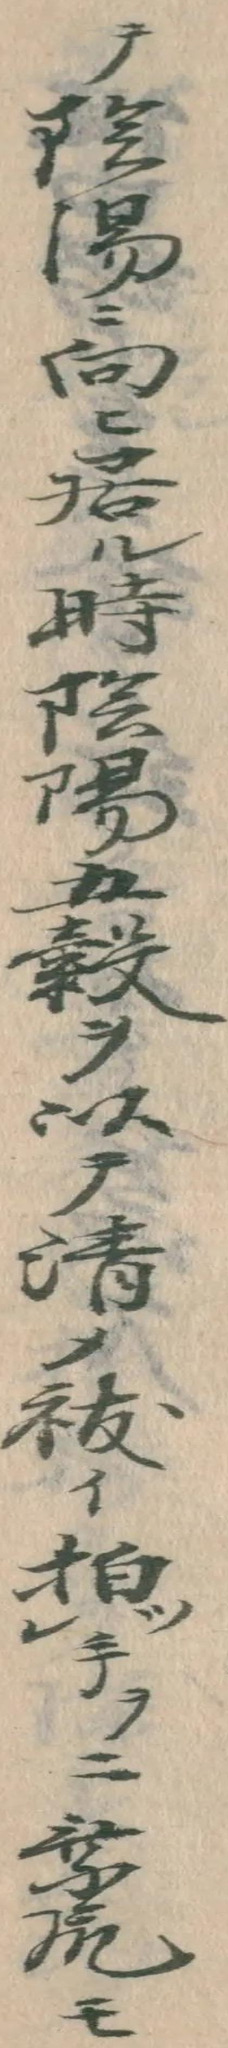テ陰陽ニ向ヒ居ル時陰陽五穀ヲ以テ清メ祓イ拍手ヲニ乗尻モ
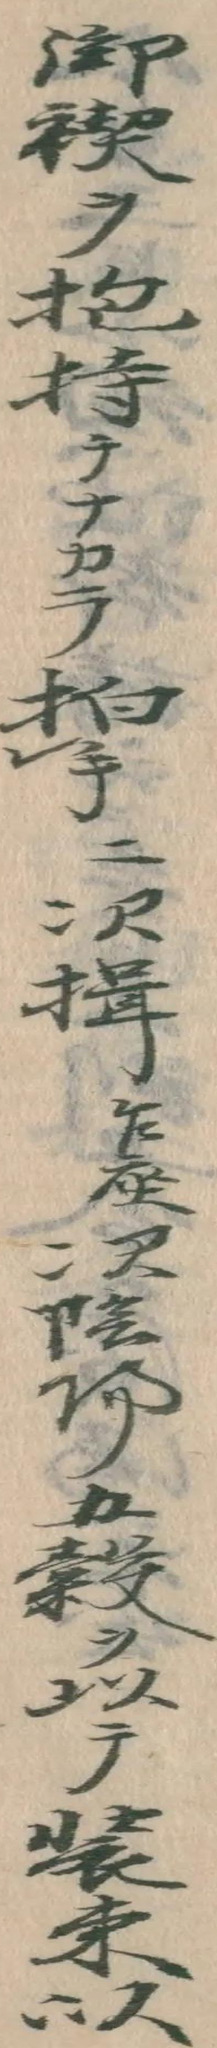御禊ヲ抱持チナカラ拍手ニ次揖乍座次陰陽五穀ヲ以テ装束以
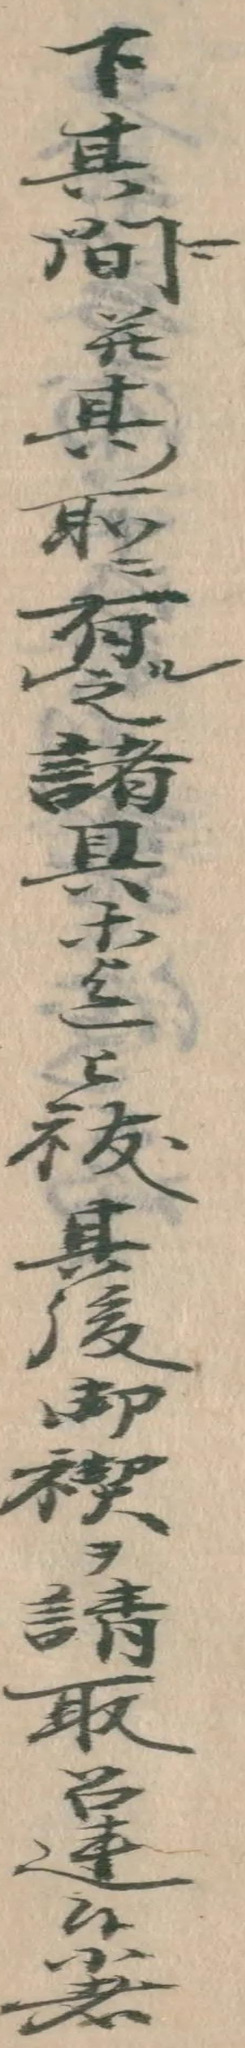下其間并其ノ所ニ有之諸具等迄祓其後御禊ヲ請取召連候小者
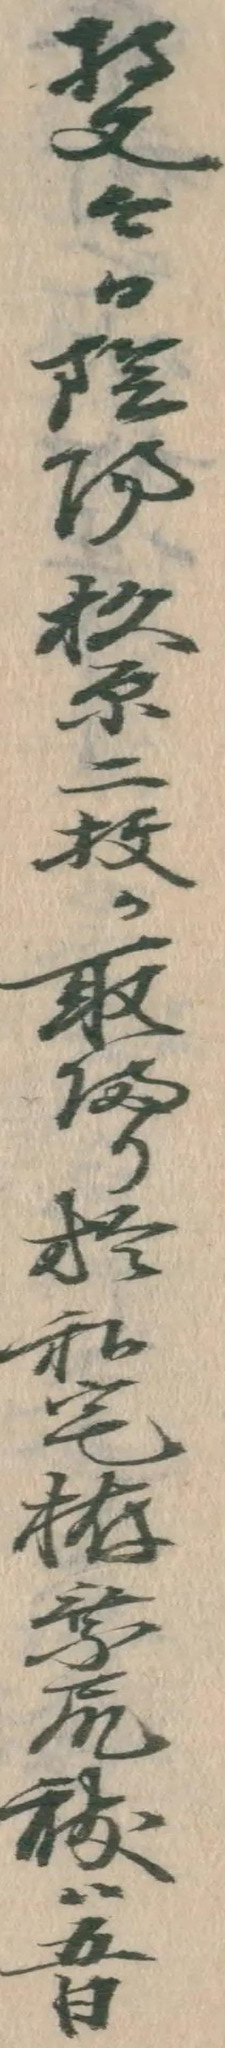将又今日陰陽杉原二枚可取帰リ於私宅拵乗尻祓ハ五日
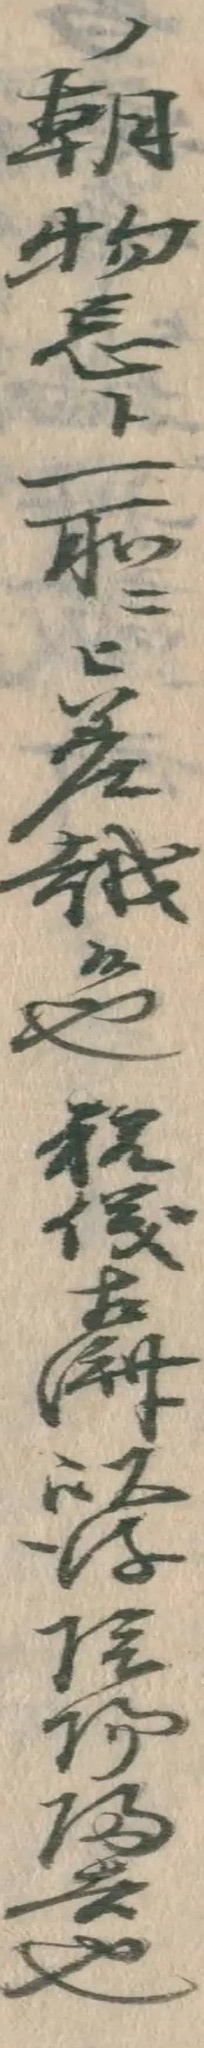ノ朝物忌ト一所ニ被差越候也祝儀相済以後陰陽帰去也
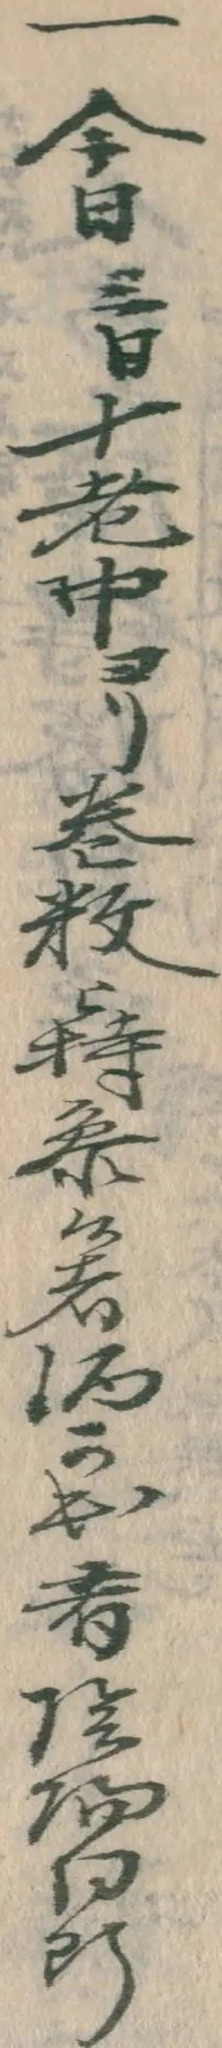一今日三日十老中ヨリ巻数被持参候者酒可出肴陰陽同断
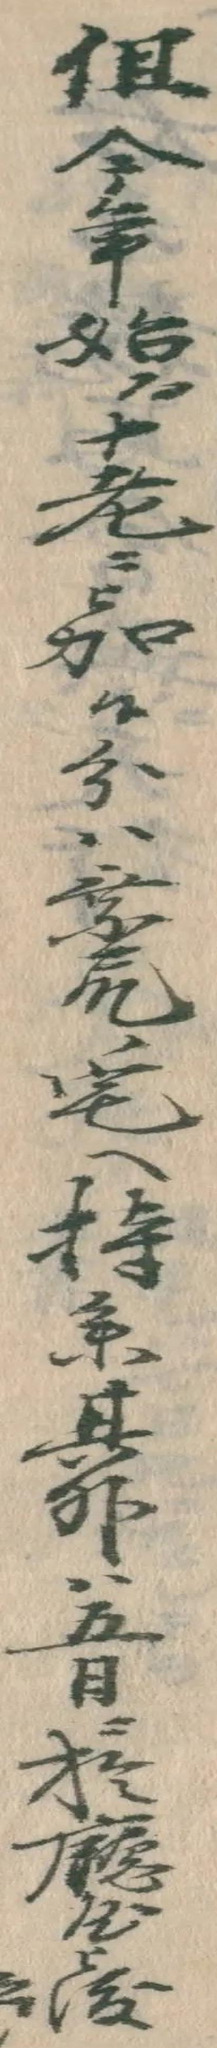但今年始而十老ニ被加候分ハ乗尻ノ宅へ持参其外ハ五日ニ於庁屋被渡云々
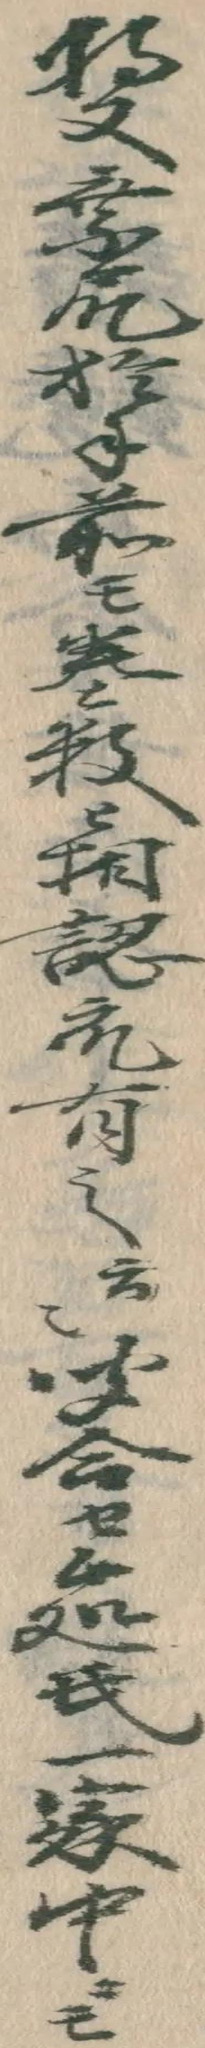将又乗尻於手前モ巻数被相認衆有之云々聞合セ候処氏一家中ニモ
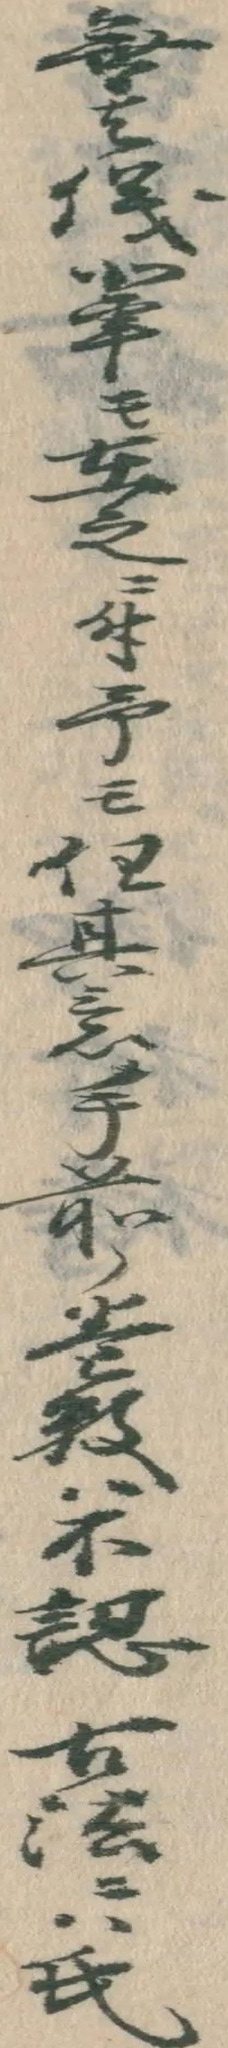無者儀輩モ在之ニ付予モ任其意手前ノ巻数ハ不認古法ニハ氏
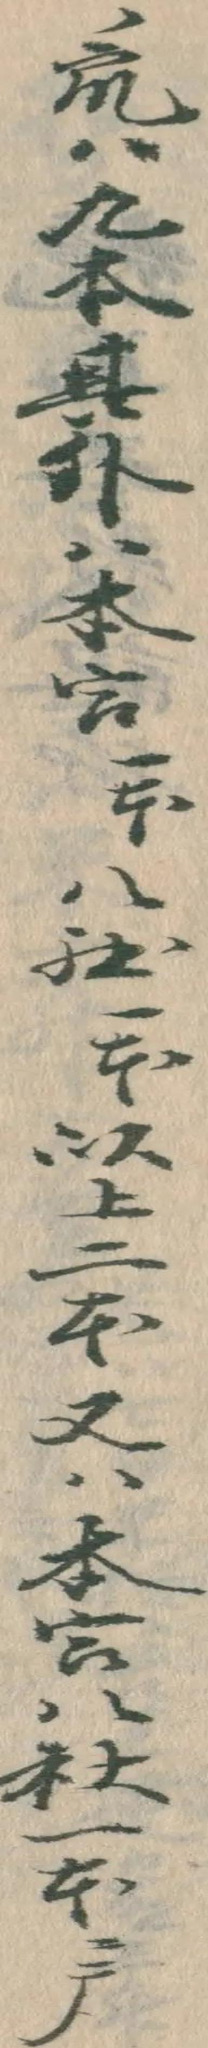ノ衆ハ九本其外ハ本宮一本八社一本以上二本又ハ本宮八社一本ニテ
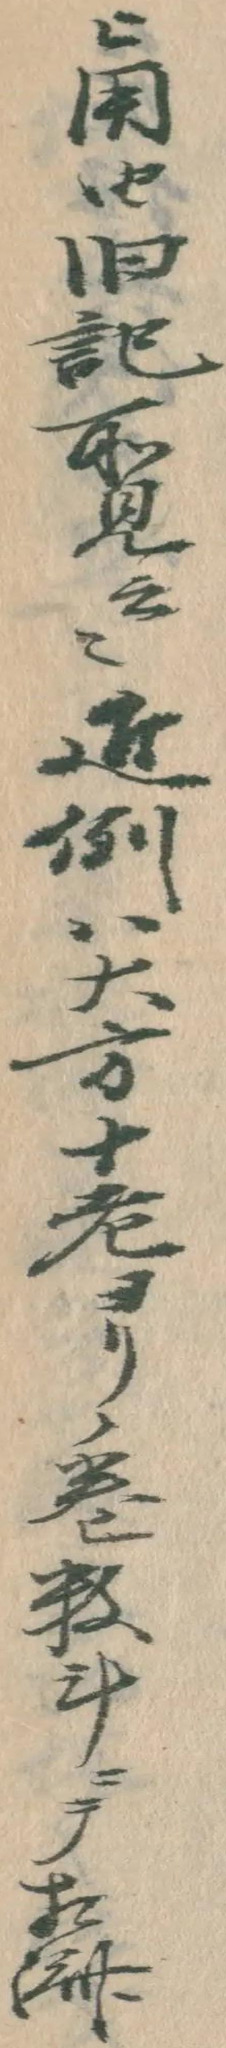被用由旧記所見云々近例ハ大方十老ヨリノ巻数計ニテ相済

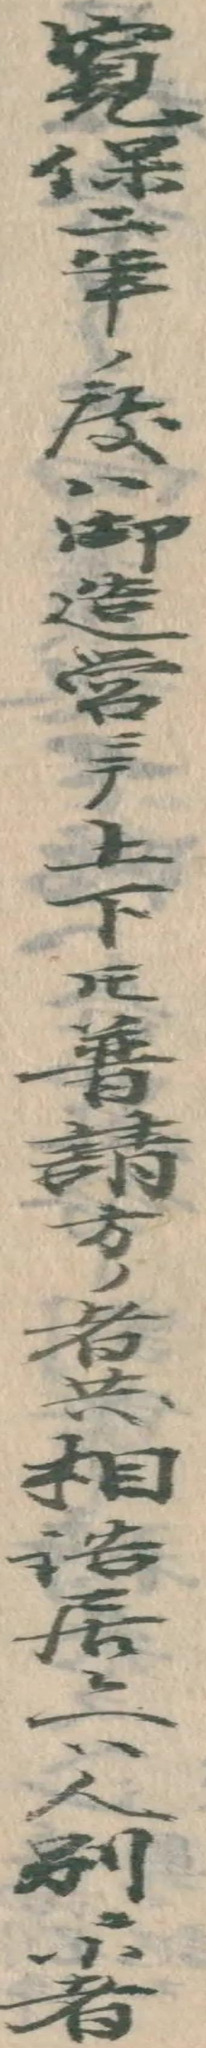寛保二年ノ度ハ御造営ニテ上下トモ普請方ノ者共相詰居候へハ人別ニ小者
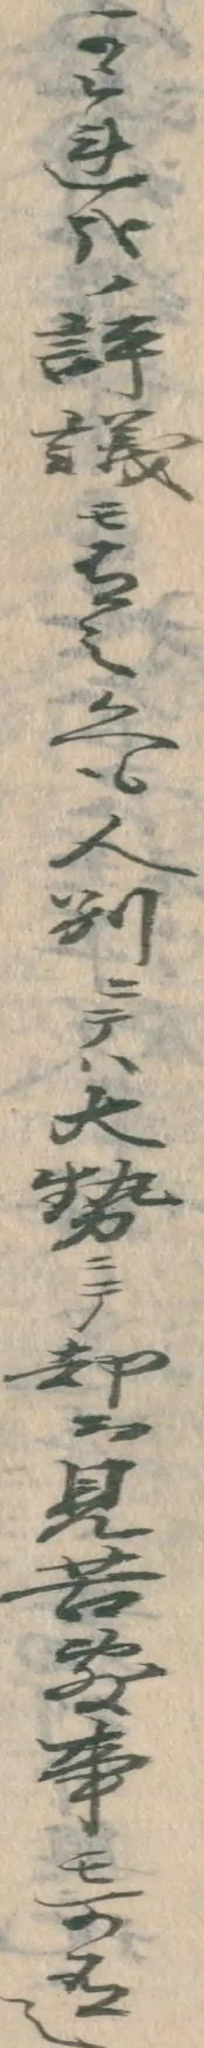可被連哉ノ評議モ有之候へモ人別ニテハ大勢ニテ却而見苦敷事モ可有之
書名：賀茂社記録. 第11冊
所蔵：国立国会図書館 National Diet Library, JAPAN
